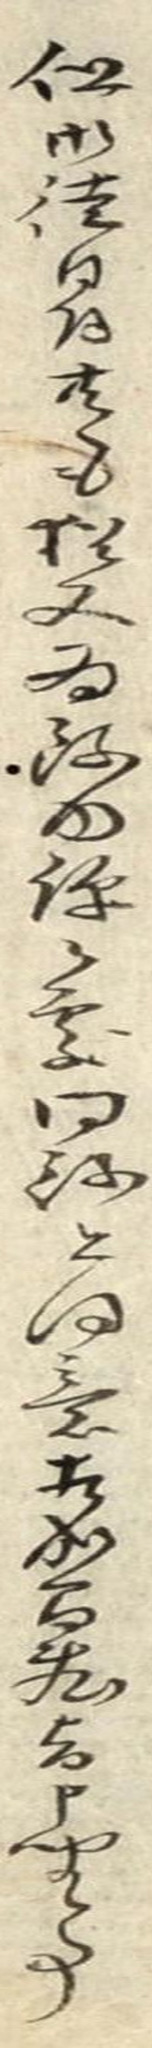但御徒目付共へも猶又為致内評候処同役と同意相成間敷旨申聞候事
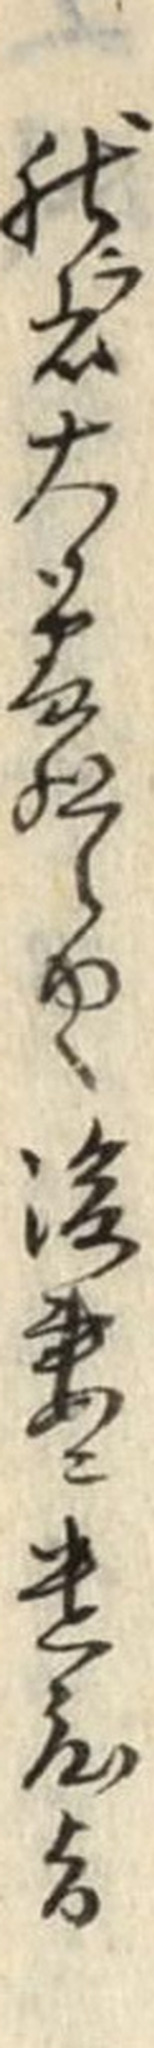然ラ者大御番組之内へ後妻ニ遣度旨

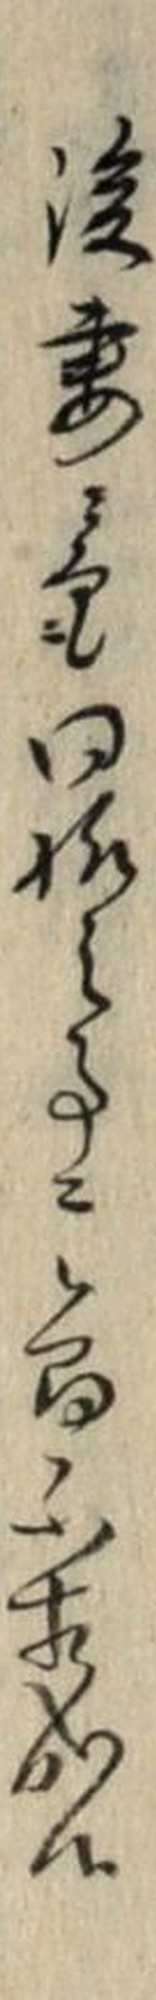後妻ニ而も同様之事ニ候間不相成候
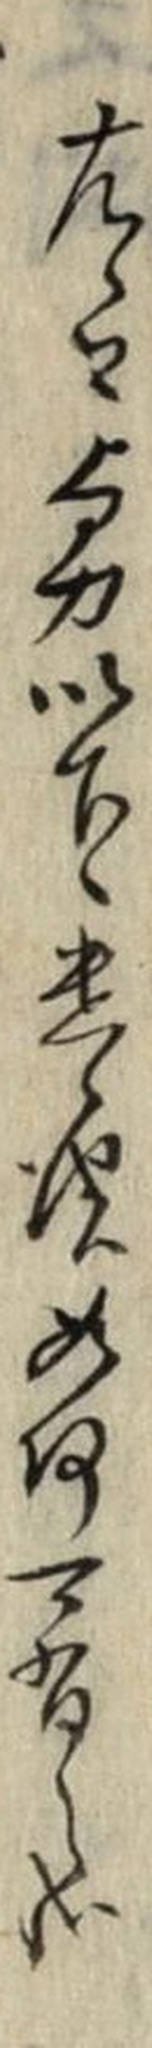左候ハヽ与力以下へ遣候儀ハ如何可有之哉
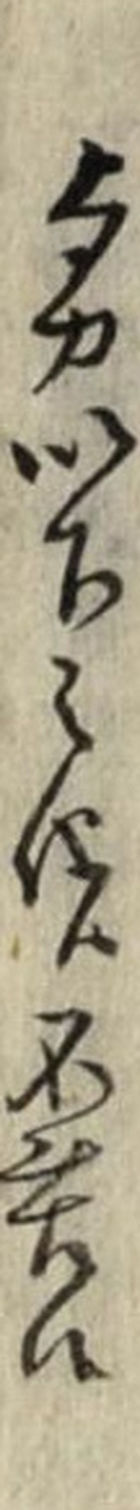与力以下之儀ハ不苦候
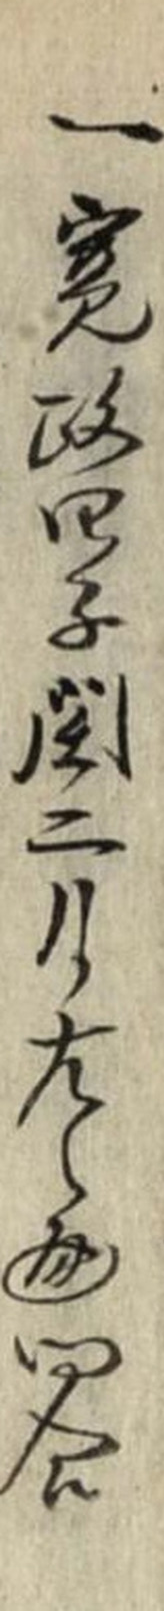一寛政四子閏二月左之通問合
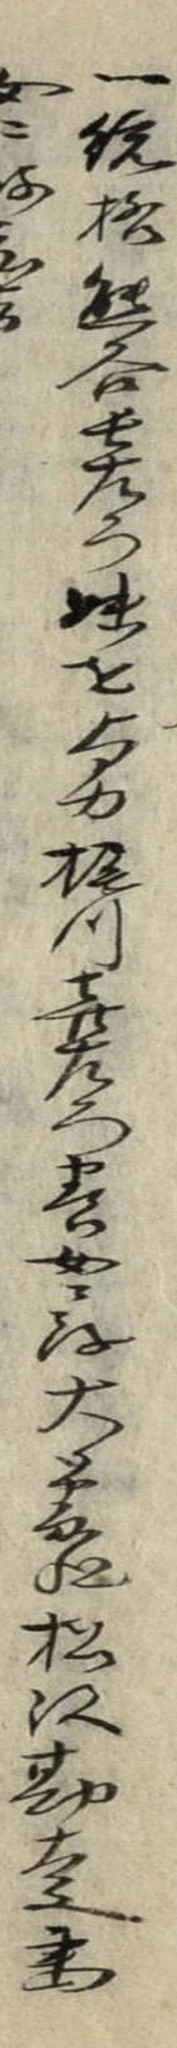一統格熊谷長左衛門妹を与力梶川喜左衛門養女ニ致大御番組松沢勘太夫妻女ニ致度旨
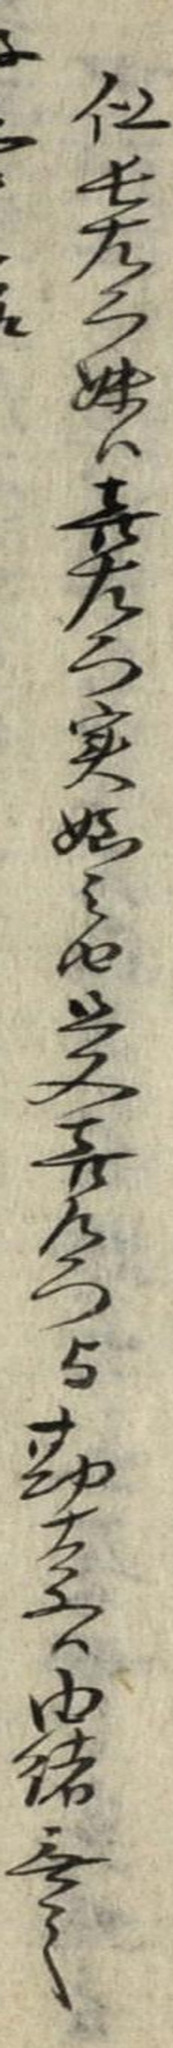但長左衛門妹ハ喜左衛門実娘之由且又喜左衛門と勘太夫ハ由緒無之
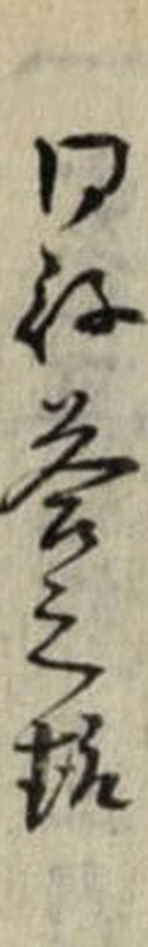同役答之趣
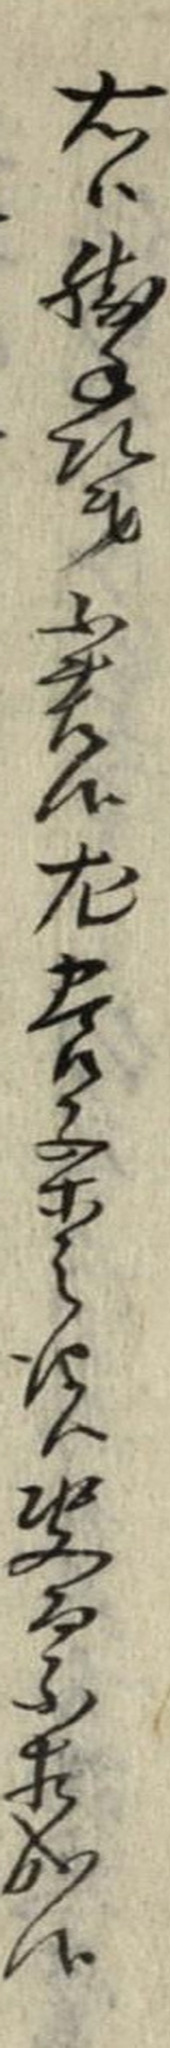右ハ勝手次第不苦候尤養子等之儀ハ決而不相成候
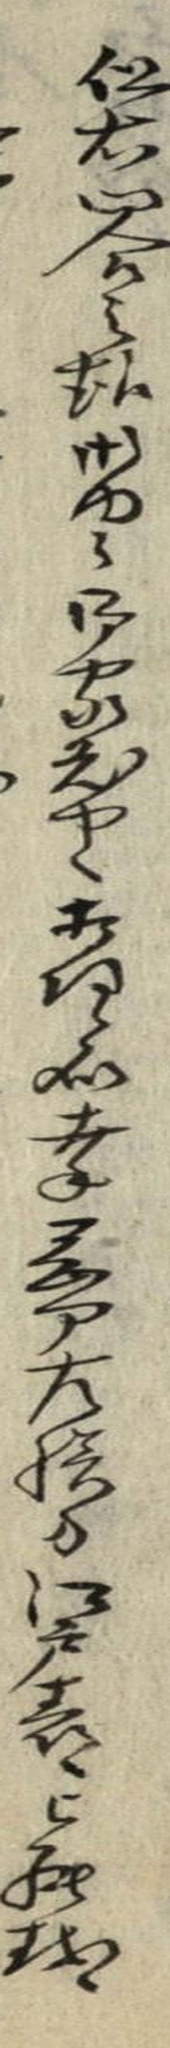但右問合之趣御内々御家老中へ相伺候処幸岡部左膳方江戸表へ罷越候
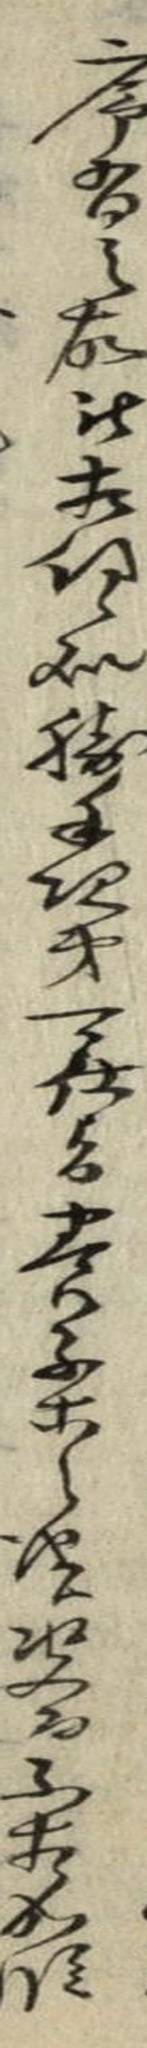序有之故被相伺候処勝手次第可仕旨養子等之儀ハ決而不相成段
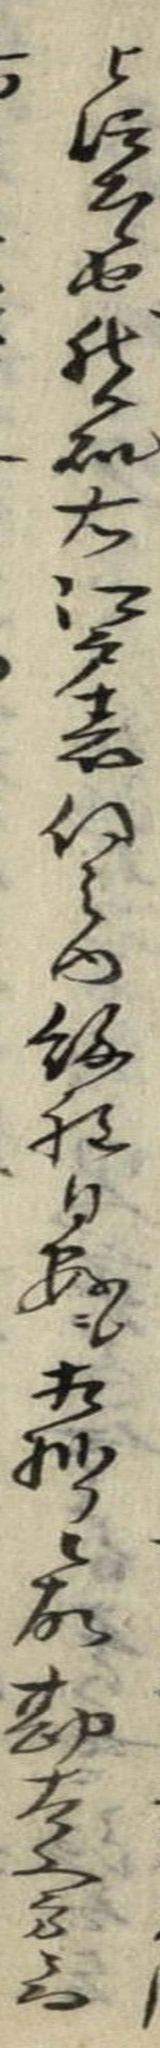被仰出候由然ル処右江戸表伺之内余程日数も相掛り候故勘太夫方ニ而
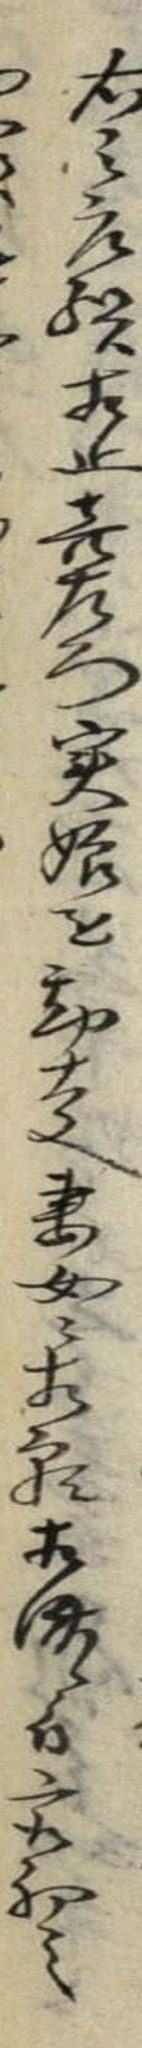右之取組ハ相止喜左衛門実娘を勘太夫妻女ニ相願相済候ニ付最初之
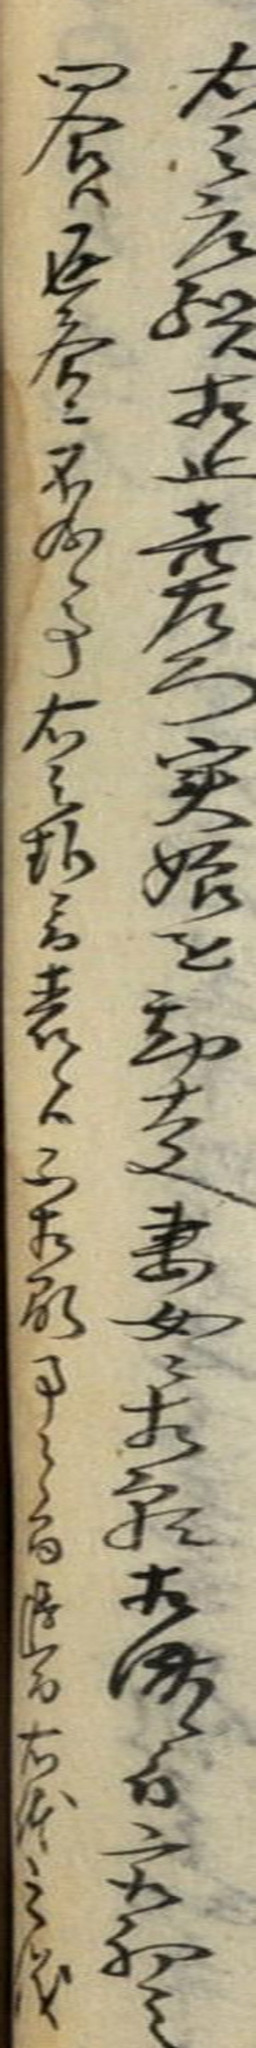問合ハ返答ニ不及候事右之趣ニ而表へハ不相顕事ニ候間右体之儀
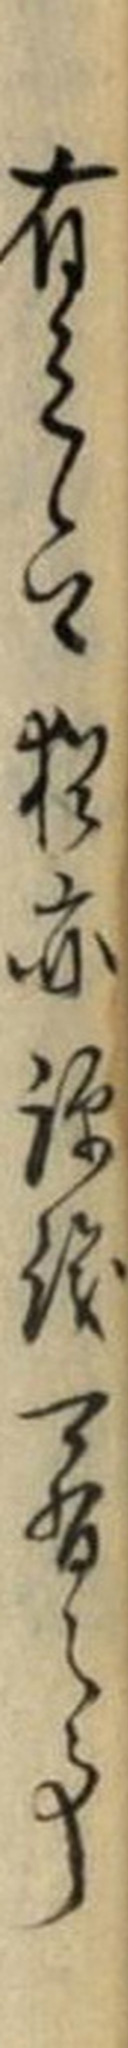有之候ハヽ猶亦評議可有之事
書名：養子縁組之部
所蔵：福井県文書館 Fukui Prefectural Archives
